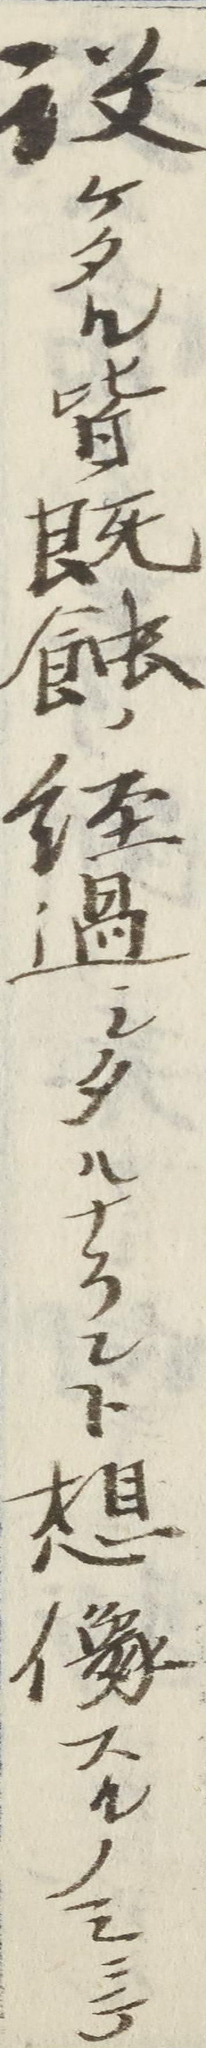設ケタル皆既蝕ノ経過シタルナラント想像スルノミニテ
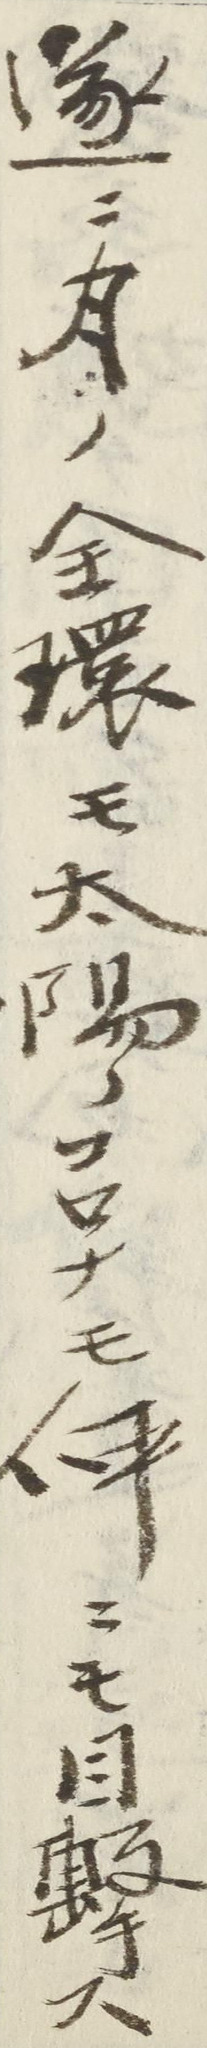遂二月ノ金環モ太陽ノコロナモ何二モ目撃ス
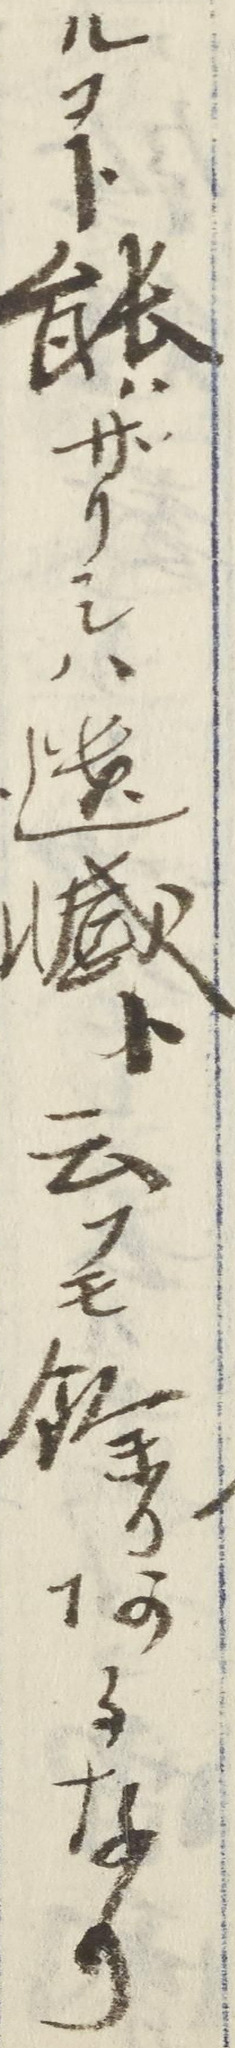ルコト能ハザリシハ遺憾ト云フモ余リ阿るなり
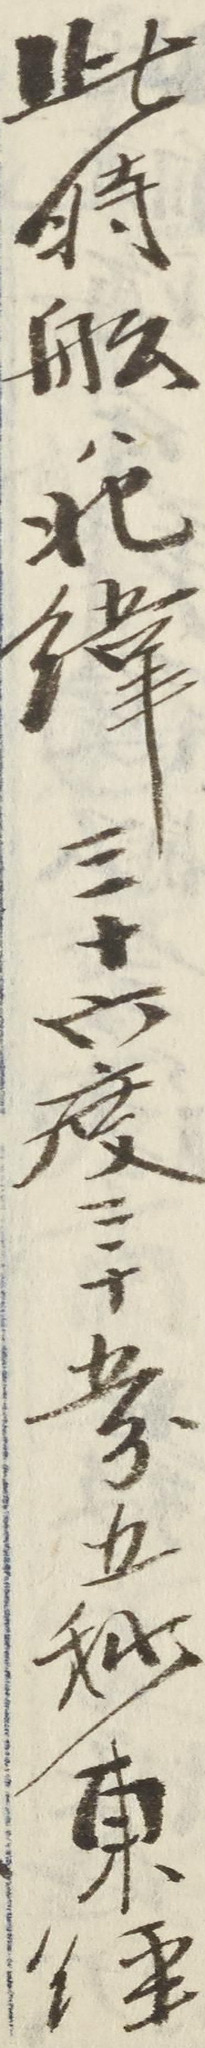此時舩ハ北緯三十六度三十五分五秒東経
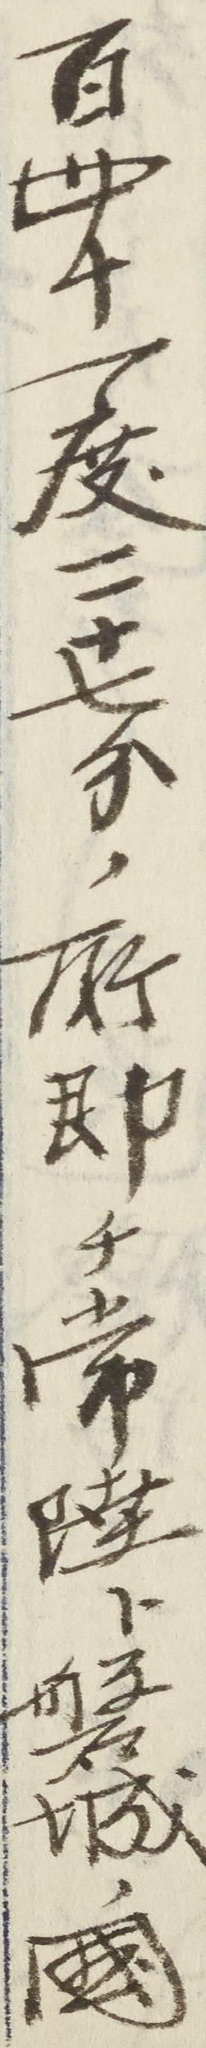百四十一度二十七分ノ所即チ常陸ト磐城ノ国
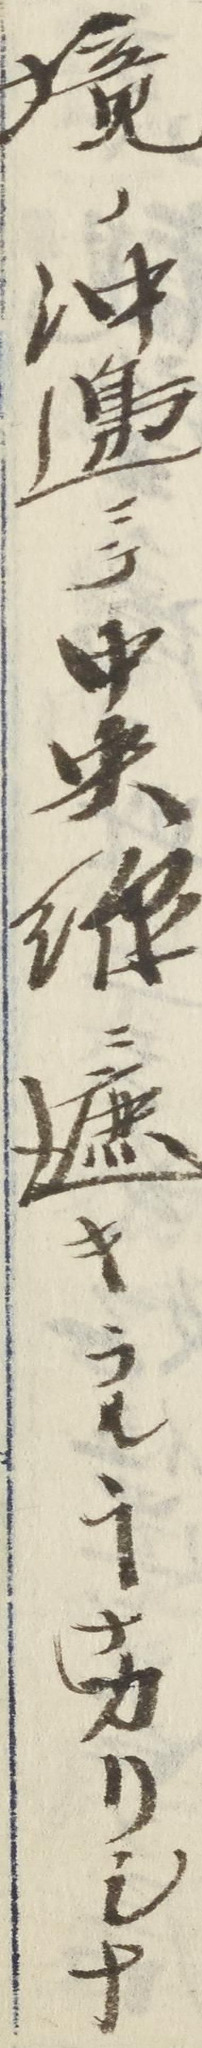境ノ沖邊ニテ中央線ニ遮キラルゝコトナカリシナ

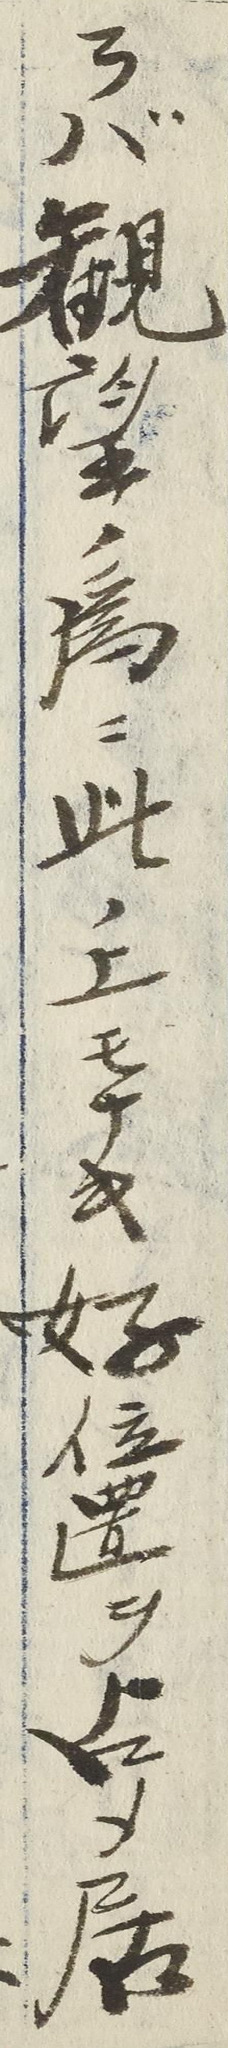ラバ観望ノ為二此ノ上モナキ好位置ヲ占メ居
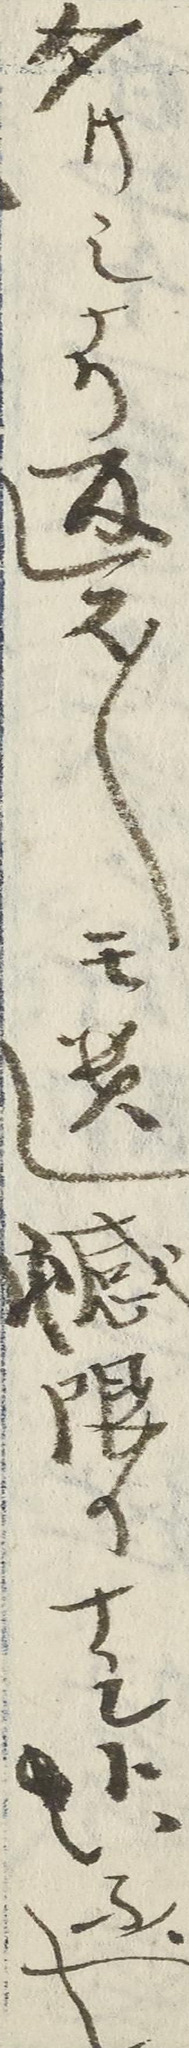タリシナリ返ス〳〵モ遺憾限リナシトいふべし
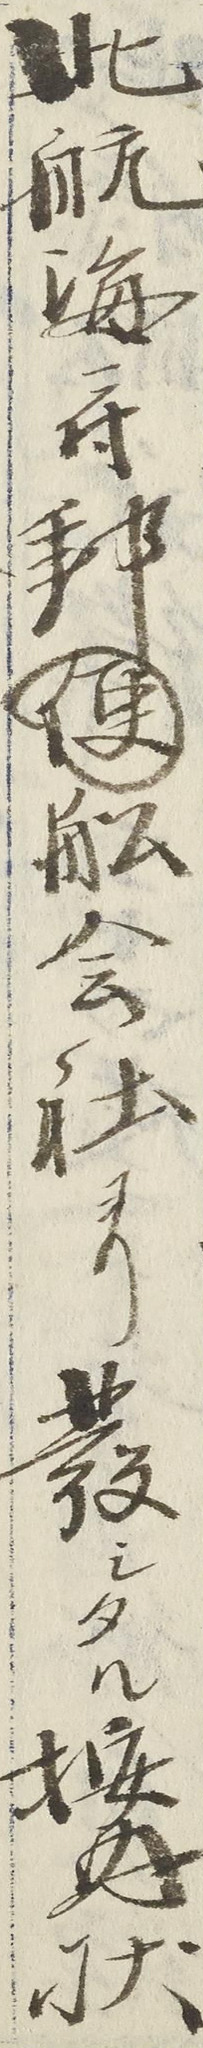此航海ニ付邦便舩会社ヨリ発シタル按内状
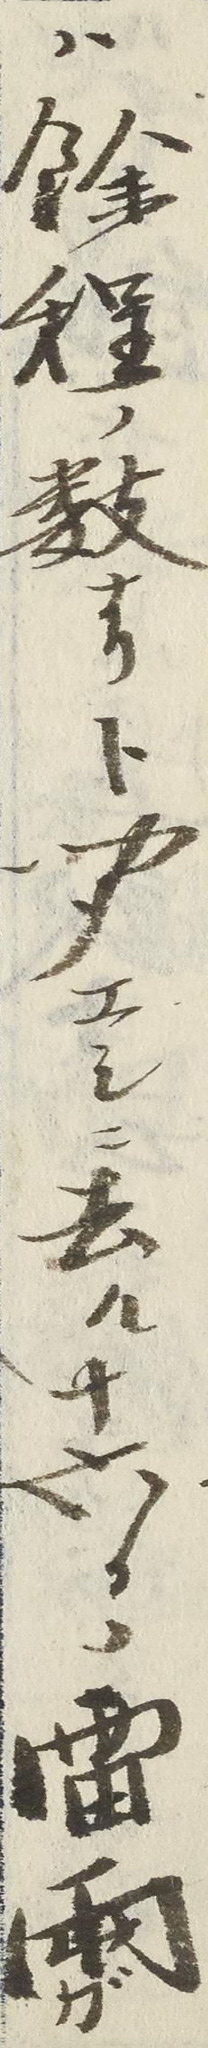ハ余程ノ数ナリト聞エシニ去ル十六日ノ雷雨ガ
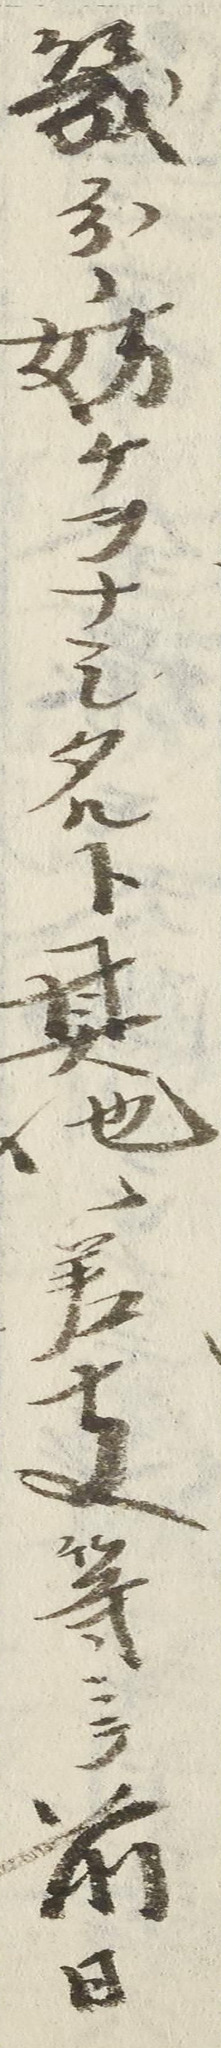幾分ノ妨ケヲナシタルコト其他ノ差支等ニテ前日
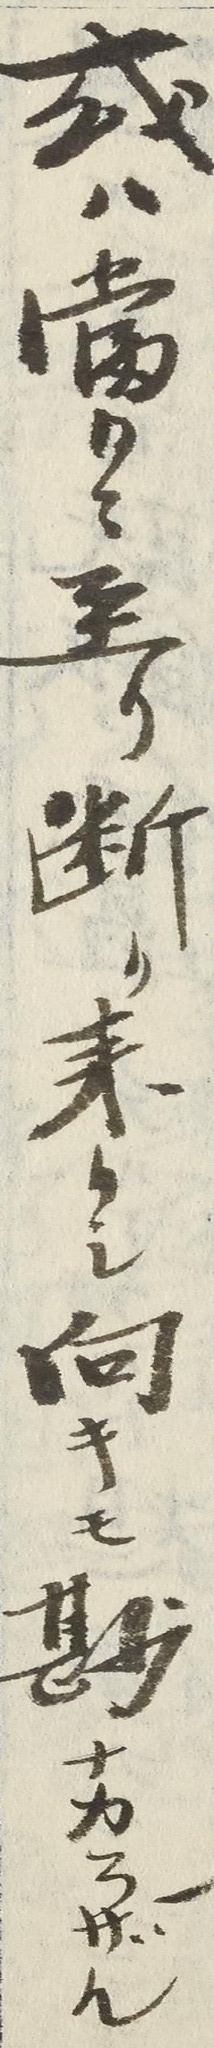或ハ当日二至リ断リ来リシ向キモ尠ナカラザル
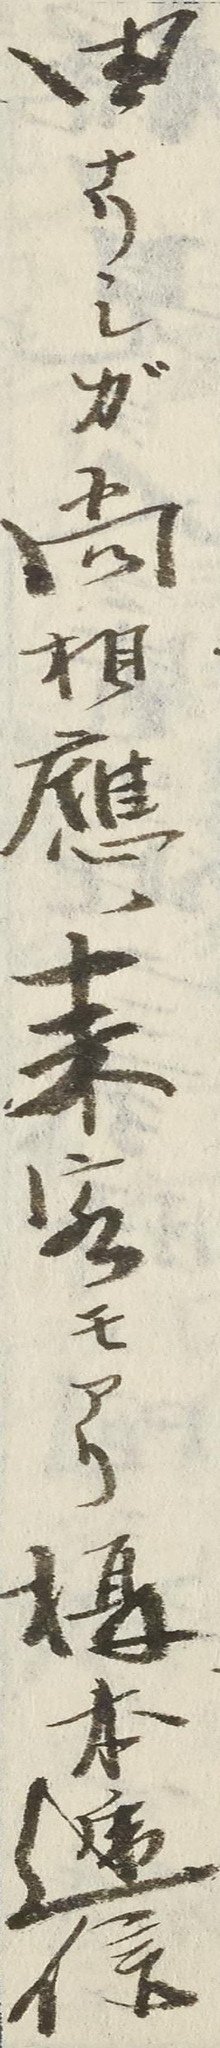由ナリシガ尚相応ノ来客モアリ榎本逓信
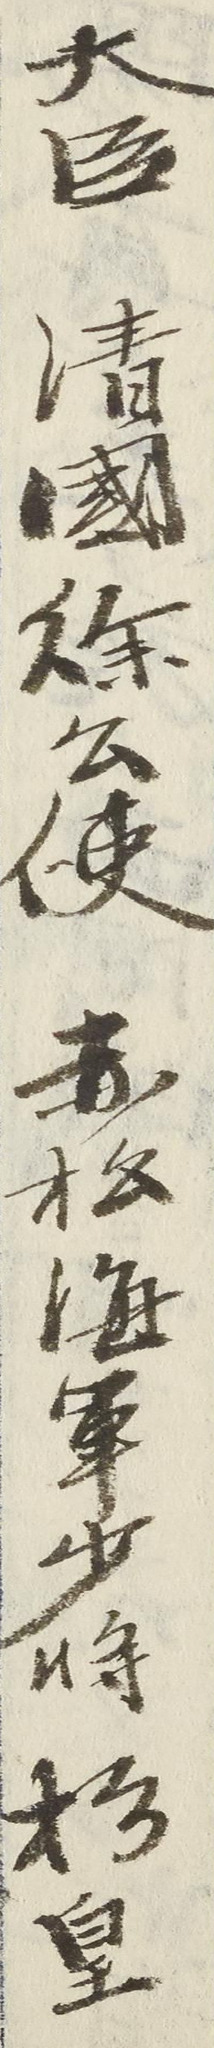大臣清国徐公使赤松海軍少将杉皇
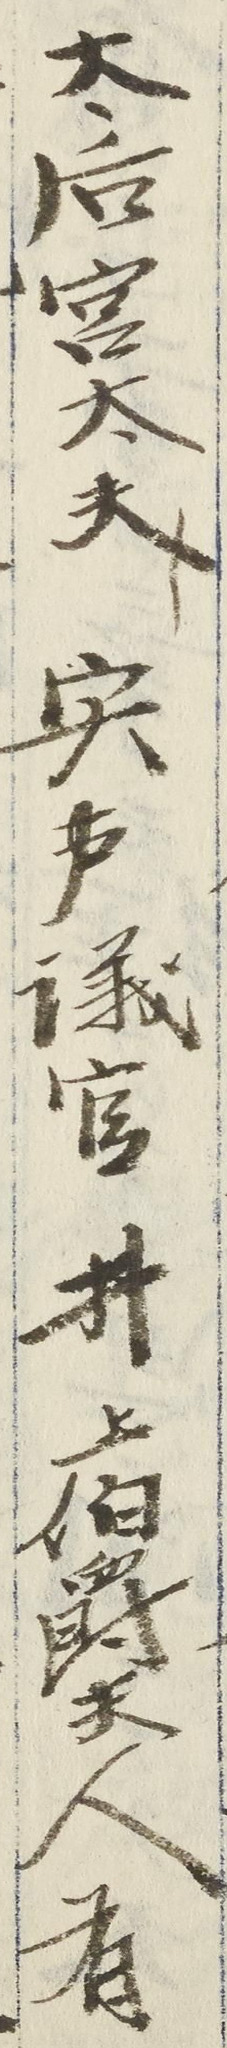太后宮太夫宍戸議官井上伯爵夫人有
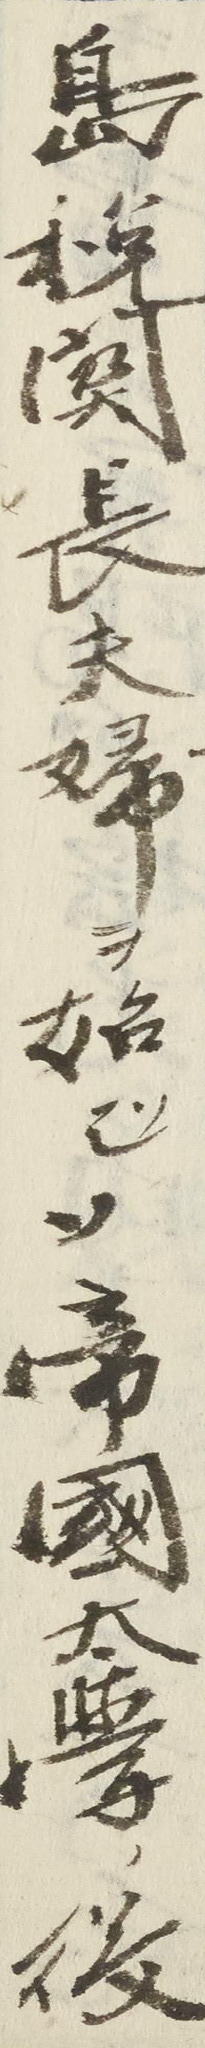島税関長夫婦ヲ始ジメ帝国大学ノ役
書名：日蝕録　全
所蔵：東京大学地震研究所図書室 Earthquake Research Institute Library, The University of Tokyo, JAPAN
